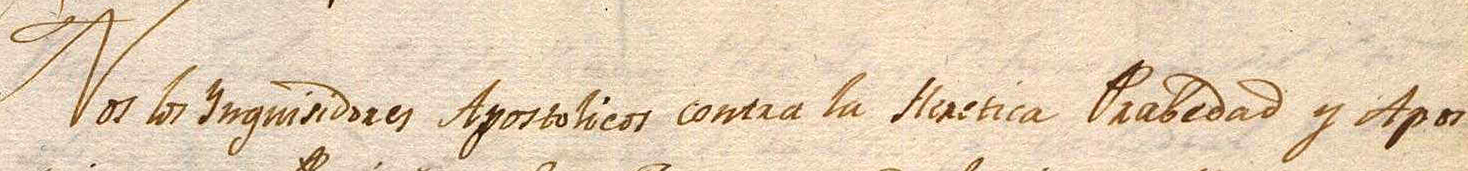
Nos los Inquisidores Apostolicos contra la Heretica Prabedad y Apos
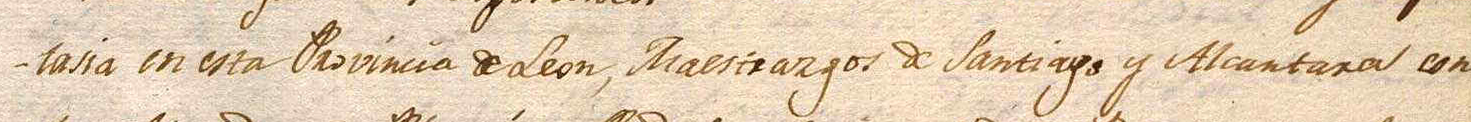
tasia en esta Provincia de Leon, Maestrazgos de Santiago y Alcantara con
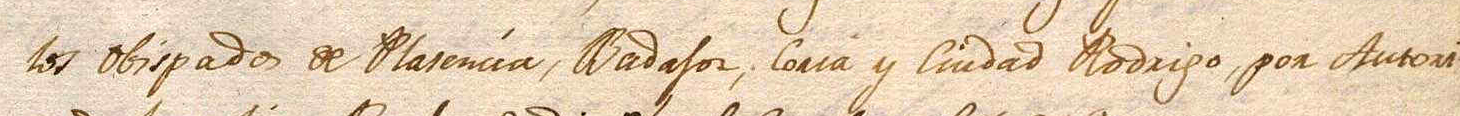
los obispados de Plasencia, Badajoz; Coria y Ciudad Rodrigo, por Autori
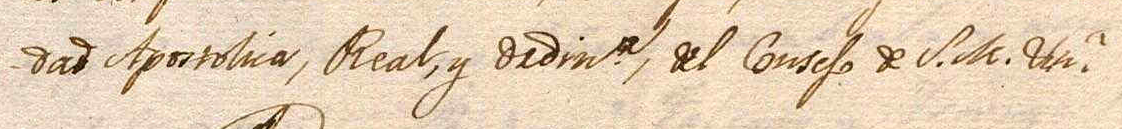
dad Apostolica, Real, y Ordin.a, del Consejo de S. M. &c.a
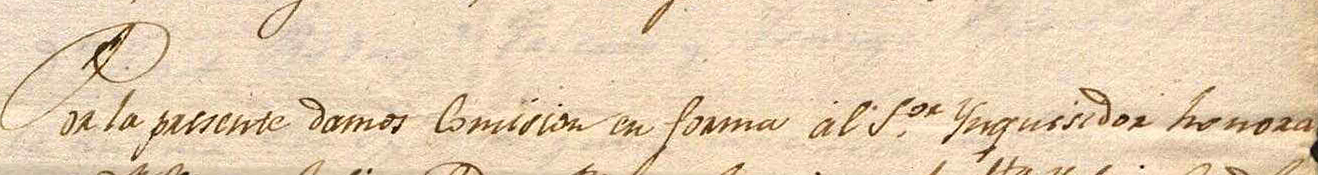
Por la presente damos Comission en forma al S.or Ynquisidor honora
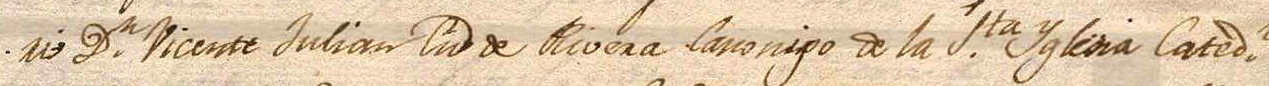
rio D.n Vicente Iulian Cid de Rivera Canonigo de la S.ta Yglesia Cated.l
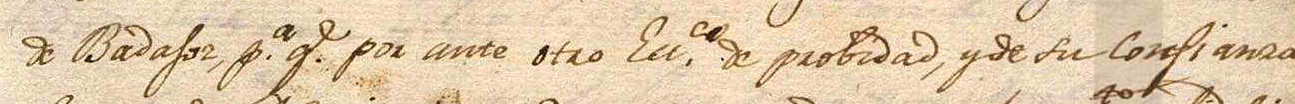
de Badajoz, p.a q.e por ante otro Ecc.co de probidad, y de su confianza
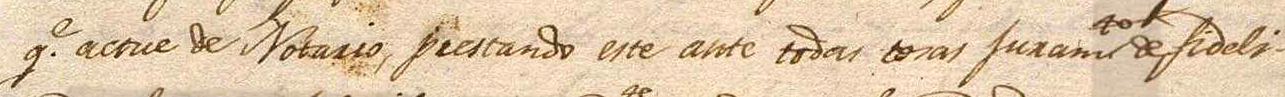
q.e actue de Notario, prestando este ante todas cosas Juramto de fideli
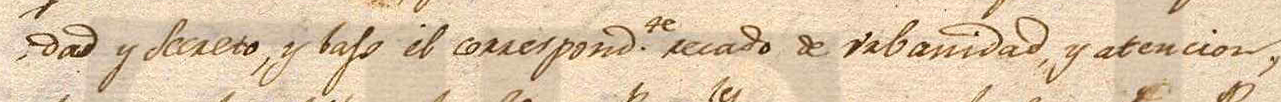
dad y secreto, y bajo il correspond.te recado de vrbanidad, y atencion,
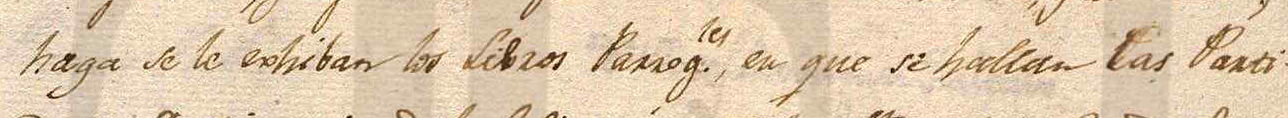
haga se le exhiban los Libros Parroq.les, en que se hallan las Parti
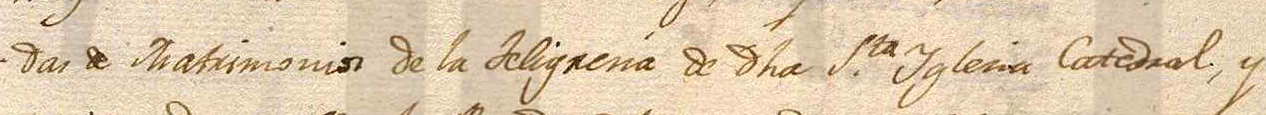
das de Matrimonios de la Feligresia de dha S.ta Iglesia Catedral, y
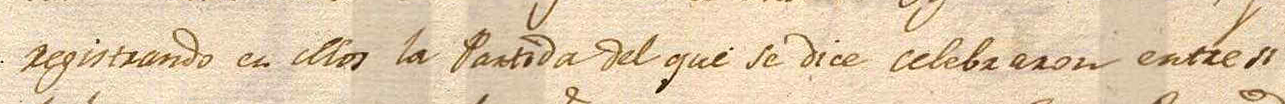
registrando en ellos la Partida del que se dice celebraron entre si
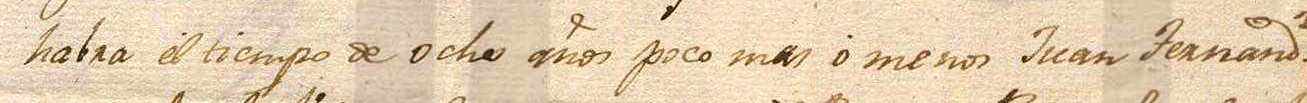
habra el tiempo de ocho años poco mas o menos Iuan Fernand.z
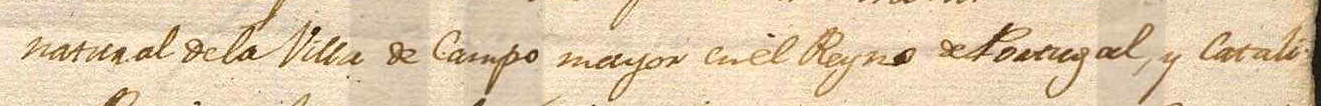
natural de la Villa de Campo mayor en el Reyno de Portugal, y Catali
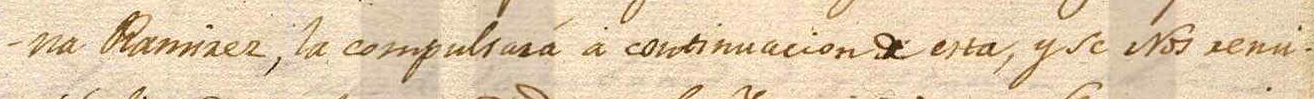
na Ramirez, la compulsará a continuacion de esta, y se Nos remi
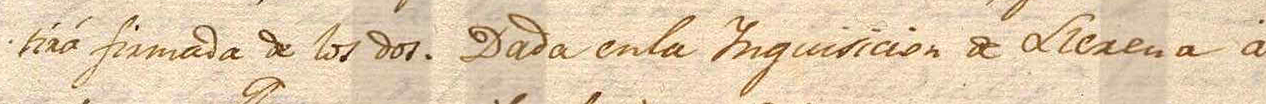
tirá firmada de los dos. Dada en la Ynquisicion de Llerena a
